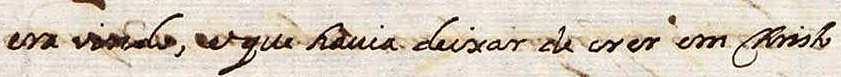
era vindo, e que hauia deixar de crer em Christo
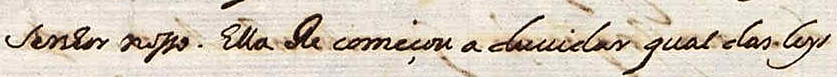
senhor nosso. Ella Re começou a duuidar qual das leys
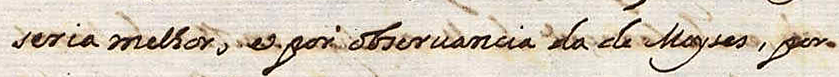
seria melhor, e por obseruancia da de Moyses, por
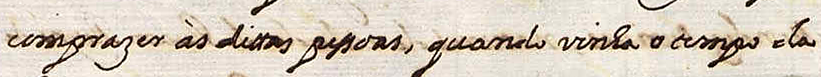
comprazer às dittas pessoas quando vinha o tempo da
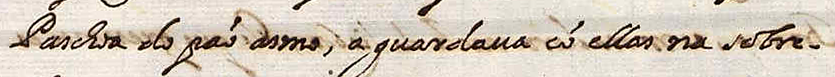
Paschoa do paõ asmo, a guardaua cō ellas na sobre
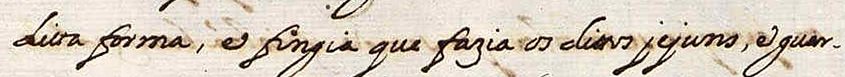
ditta forma, e fingia que fazia os dittos jejuns, e guar
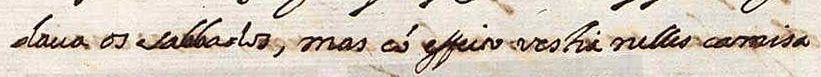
daua os sabbados, mas cō effeito vestia nelles camisa
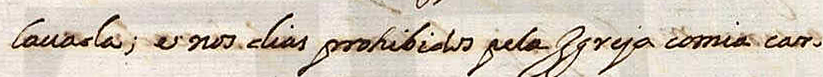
lauada; e nos dias prohibidos pela Jgreja comia car
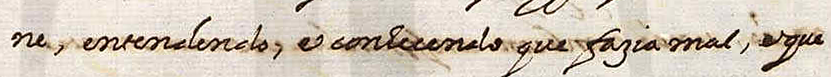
ne, entendendo, e conhecendo que fazia mal, e que
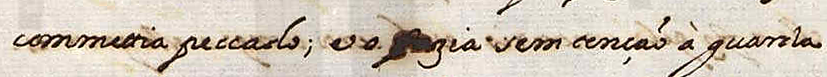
commettia peccado; e o fazia sem tençaõ à guarda
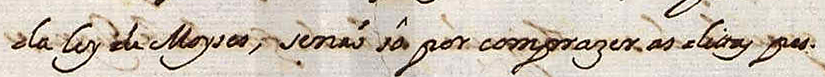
da ley de Moyses; senaõ sô por comprazer as dittas pes
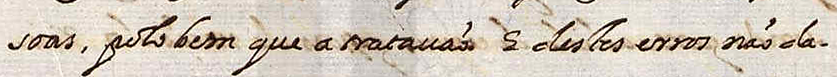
soas, pelo bem que a tratauaõ E destes erros naõ da
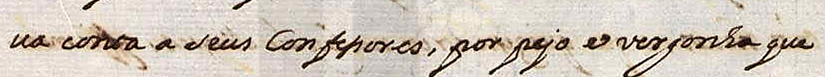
ua conta a seus confessores, por pejo e vergonha que
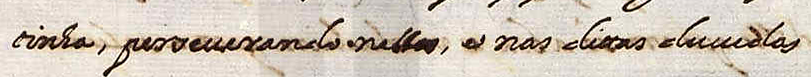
tinha, perseuerando nellas, e nas dittas duuidas
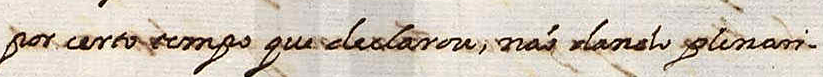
por certo tempo que declarou, naõ dando plenari
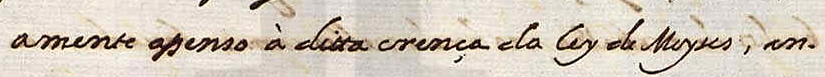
amente assenso à ditta crença da ley de Moyses, an
